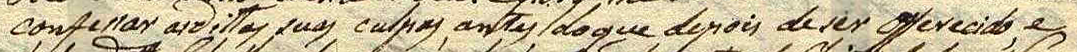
confessar as dittas suas culpas, antes, do que depois de ser Offerecido, e
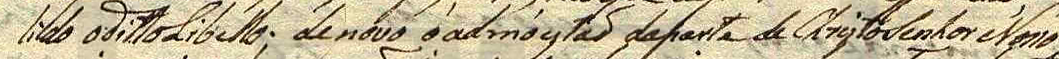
lido o ditto Libello; de novo o admoestaõ da parte de Christo Senhor Nosso
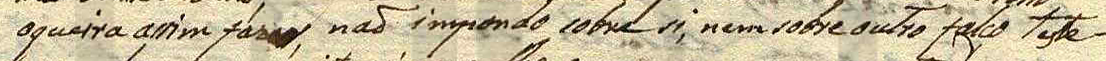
o queira assim fazer, naõ impondo sobre si, nem sobre outro falço teste
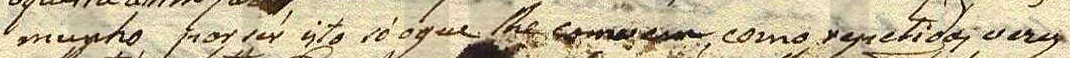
munho por ser isto só o que lhe comvem, como repetidas vezes
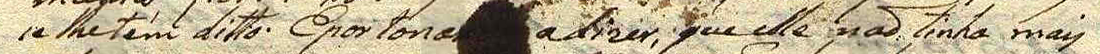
se lhe tem ditto. E por tona_ a dizer, que elle naõ tinha mais
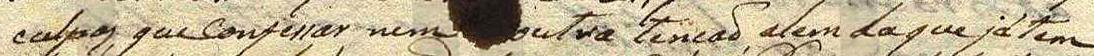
culpas, que confessar, nem _outra tençaõ, alem da que já tem
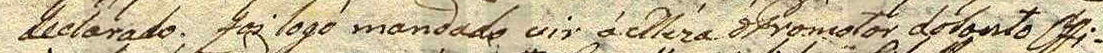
declarado; foi logo mandado vir á Meza o Promotor do Santo Offi
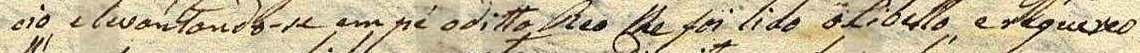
cio, e levantando-se em pé o ditto Reo lhe foi lido o Libello, e requereo
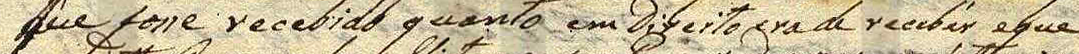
que fosse recebido quanto em Direito era de receber, e que
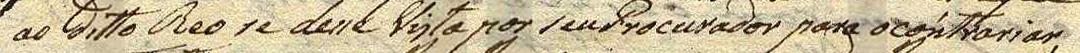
ao ditto Reo se desse Vista por seu Procurador para o contrariar,
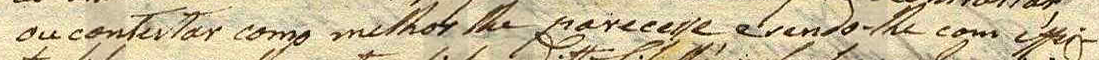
ou contestar como melhor lhe parecesse, e sendo-lhe com effei
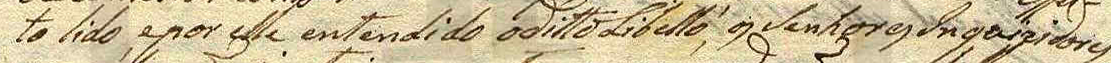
to lido, e por elle entendido o ditto Libello, os Senhores Inquizidores
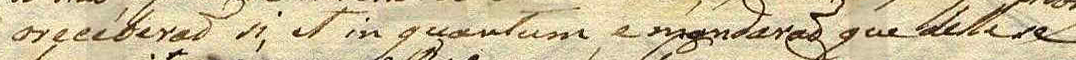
o receberaõ si, et in quantum, e mandarão que delle se
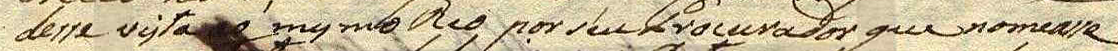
desse vista _o mesmo Reo por seu Procurador que nomeasse
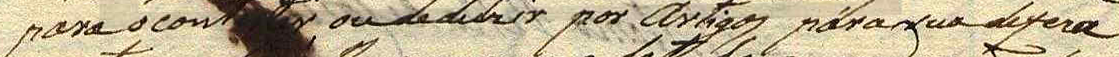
para o cont_ar, ou deduzir por Artigos para sua defeza
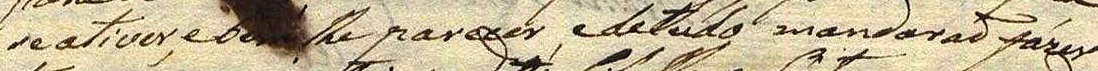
se a tiver, e bem lhe parecer, e de tudo mandaraõ fazer
